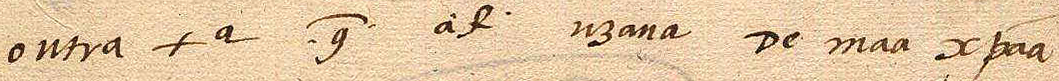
outra ta .q̄. a .R. uzaua De maa xpāa
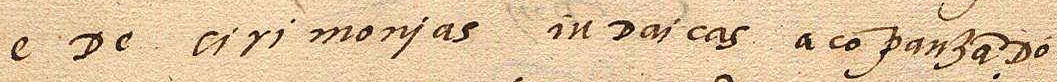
e De cirimonjas iuDaicas acōpanhāDo
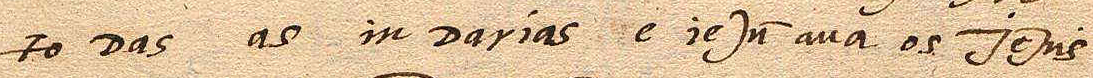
toDas as iuDarias e ieJūaua os Jejus
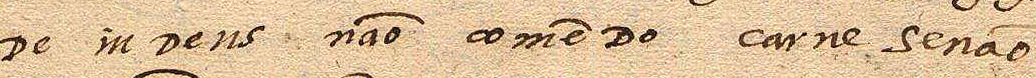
De iuDeus não comēDo carne senão
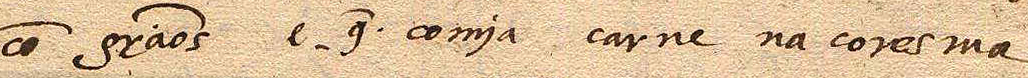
c̄o grãos e .q̄. comja carne na coresma
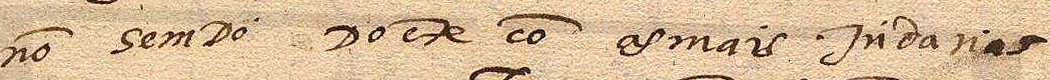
nō semDo Doēte c̄o as mais .Judarias
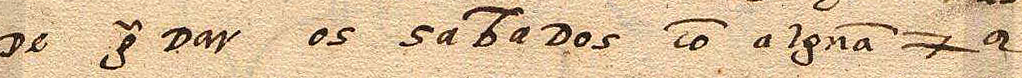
De ḡDar os sabaDos c̄o algūa ta
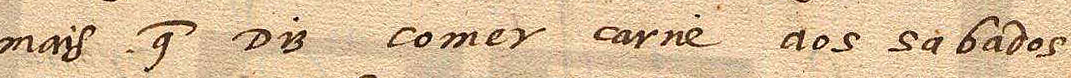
mais .q̄ Diz comer carne aos sabados
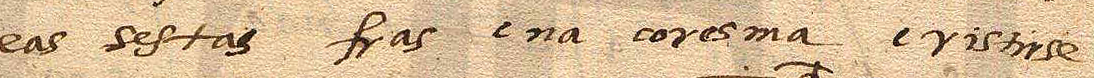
e as sestas fras e na coresma e vistirse
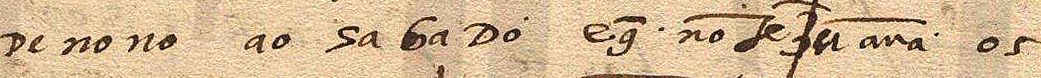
De nouo ao sabaDo e q̄. n̄o JeJūaua. os
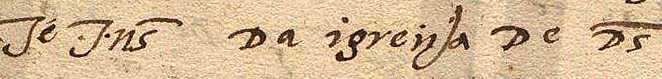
JeJus̄ Da igreiiJa De D̄s
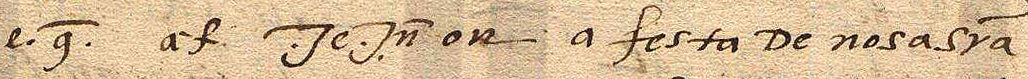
e .q̄. a .R. JeJūou a festa De nosa Sr̄a
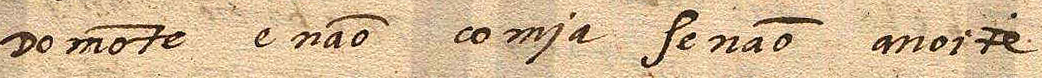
Do mōte e não comja senão a noite
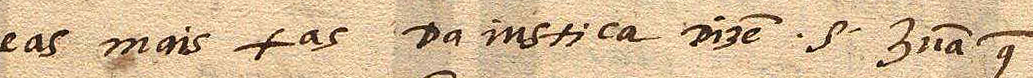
e as mais tas Da iustica Dizē .s. hūa q̄
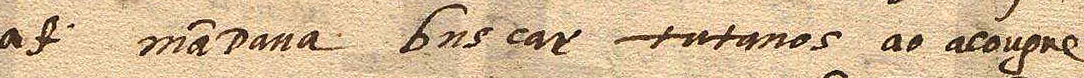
a R. māDaua buscar tutanos ao acougue
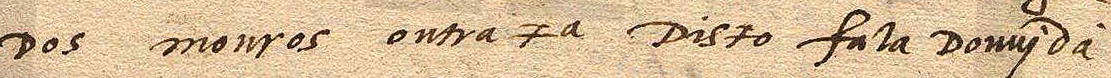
Dos mouros outra ta Disto fala Douujda
